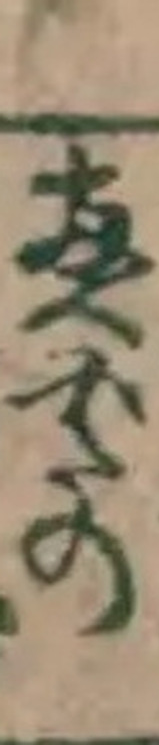両人にたの
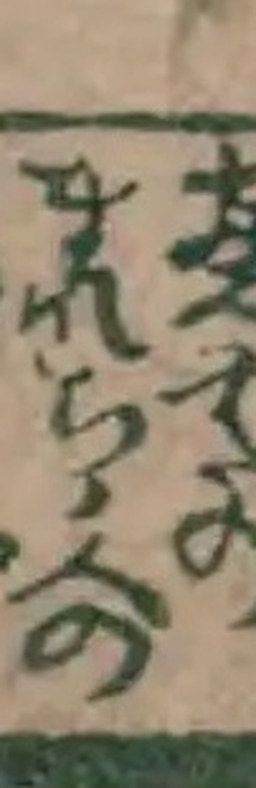まれちか人の
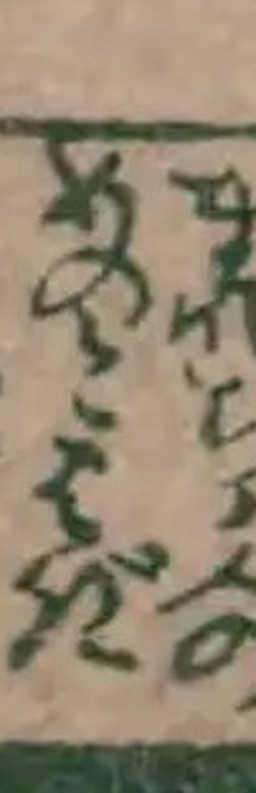めのとはぎ
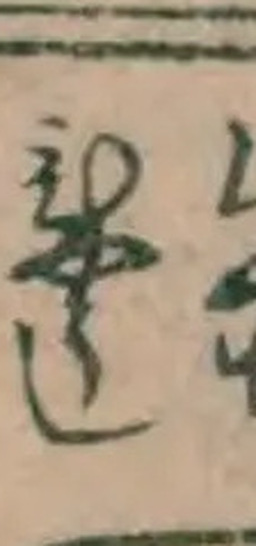ひやうし
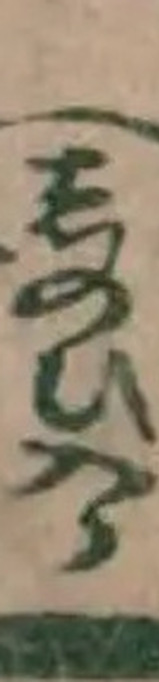しのひ入ら
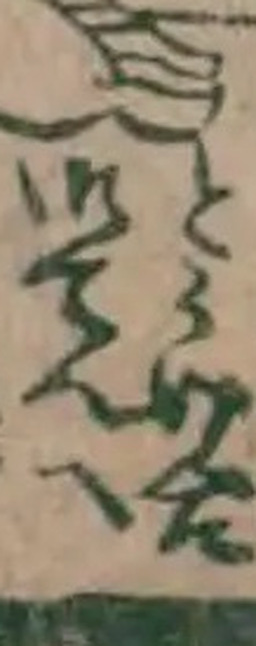御てんへ
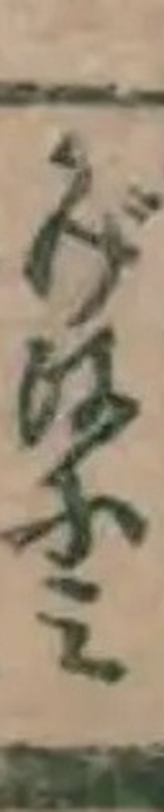かげ政にみ
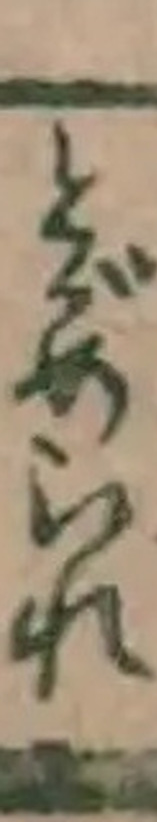とがめられ
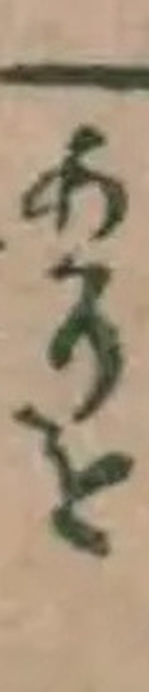あかりを
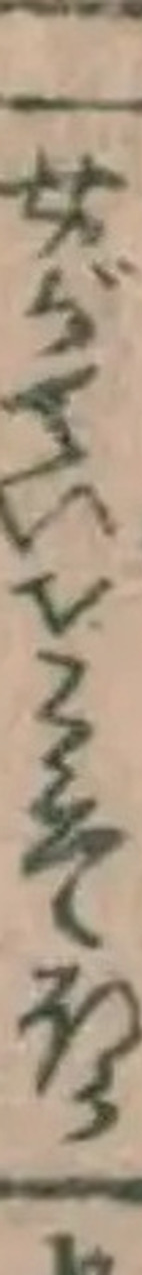女がていをみてほかにて
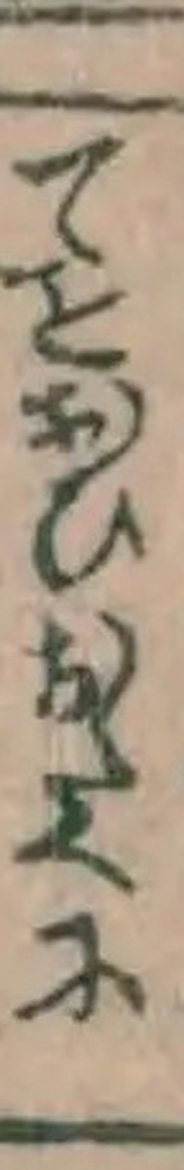てをおひおたへに
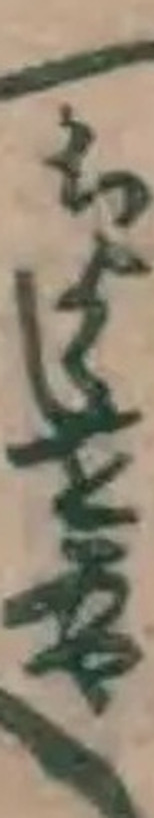ちよくしをあや
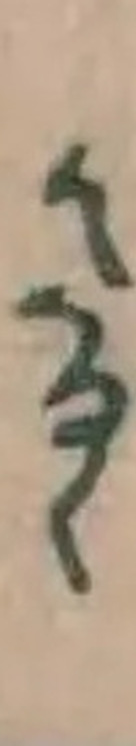かたるゝ
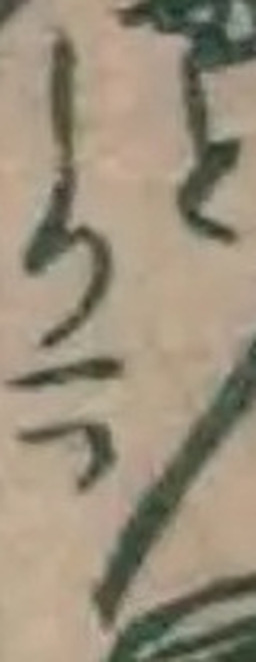しり一つ
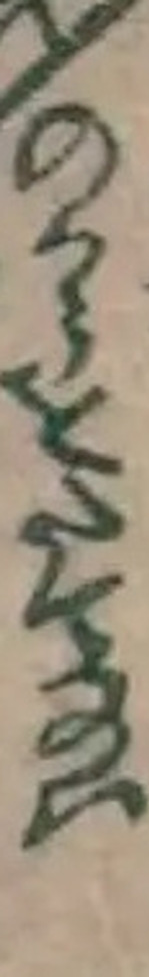のかうをたてなは
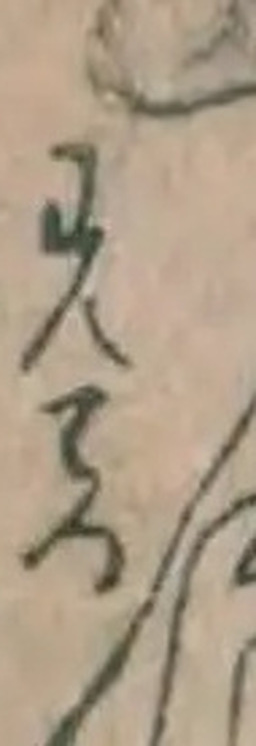わんてつ
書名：伊達錦對将 : 森田座
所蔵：国立国会図書館 National Diet Library, JAPAN
